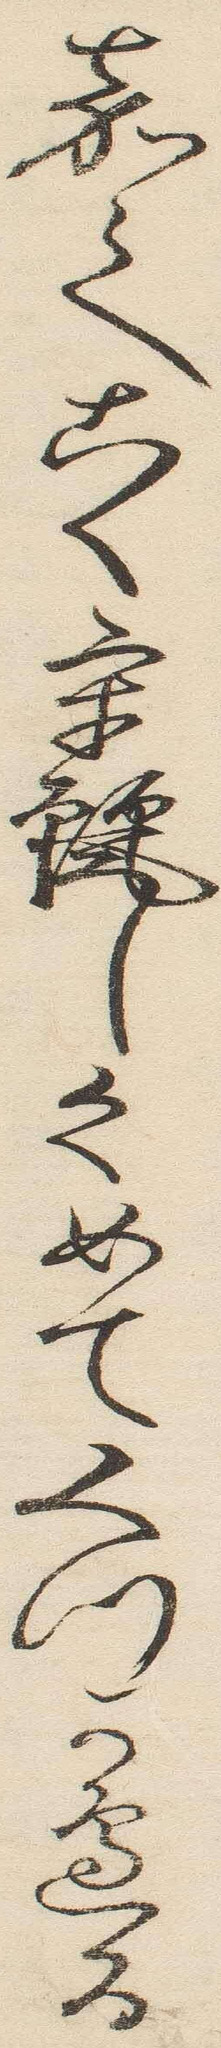かしこくうれしくめてくつかへる
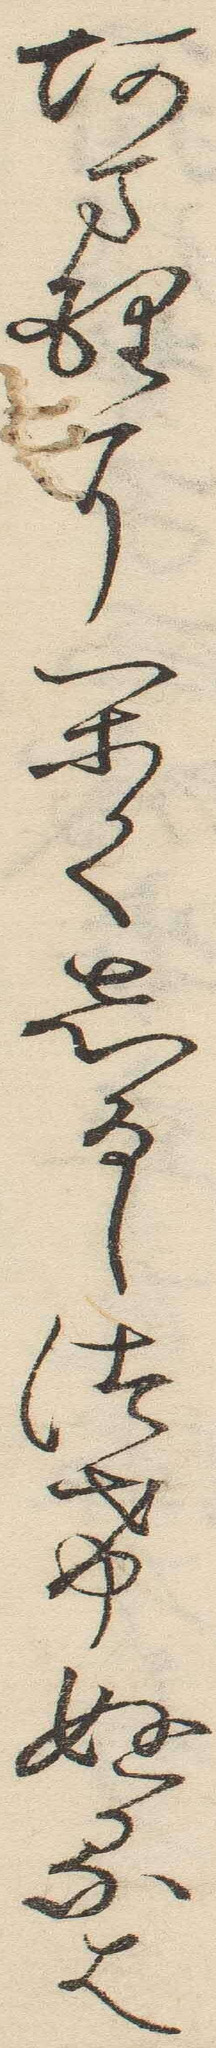あまりにかくしるしつけぬるは
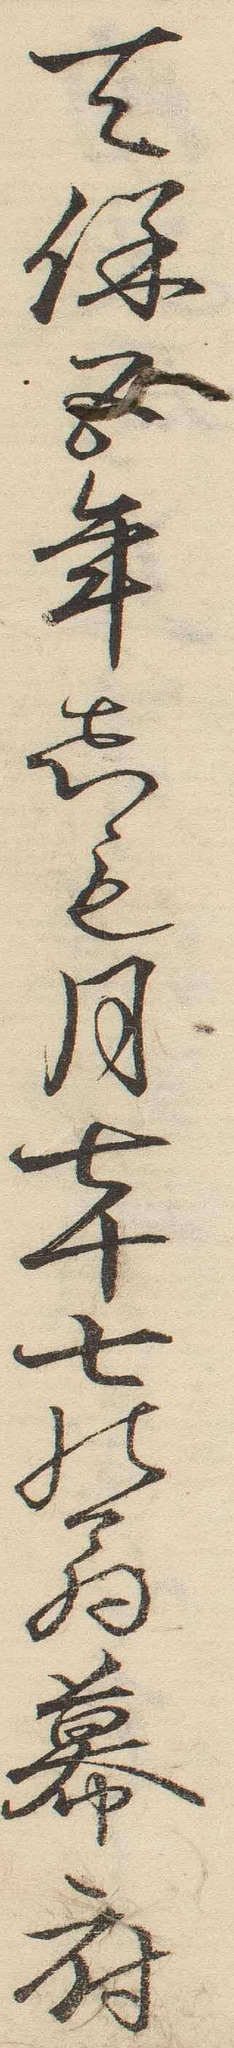天保五年しも月七十七の翁幕府

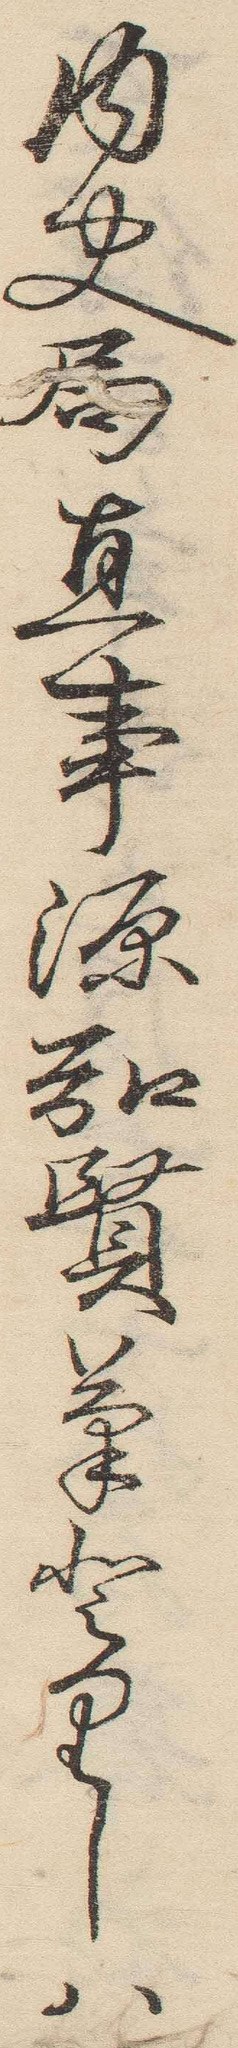内史局直事源弘賢筆とりしは
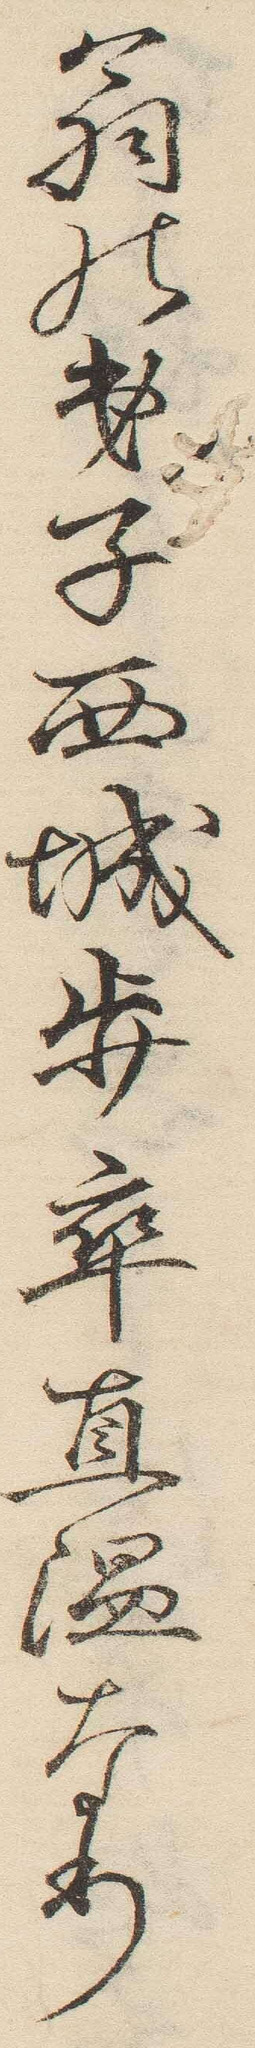翁の弟子西城歩卒直温なり
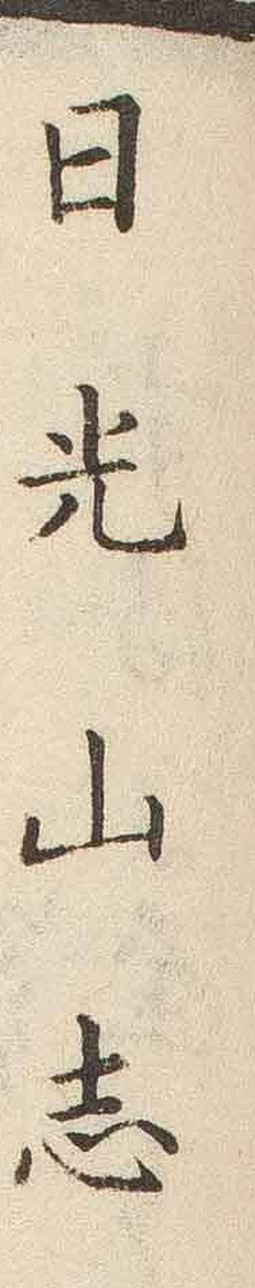日光山志
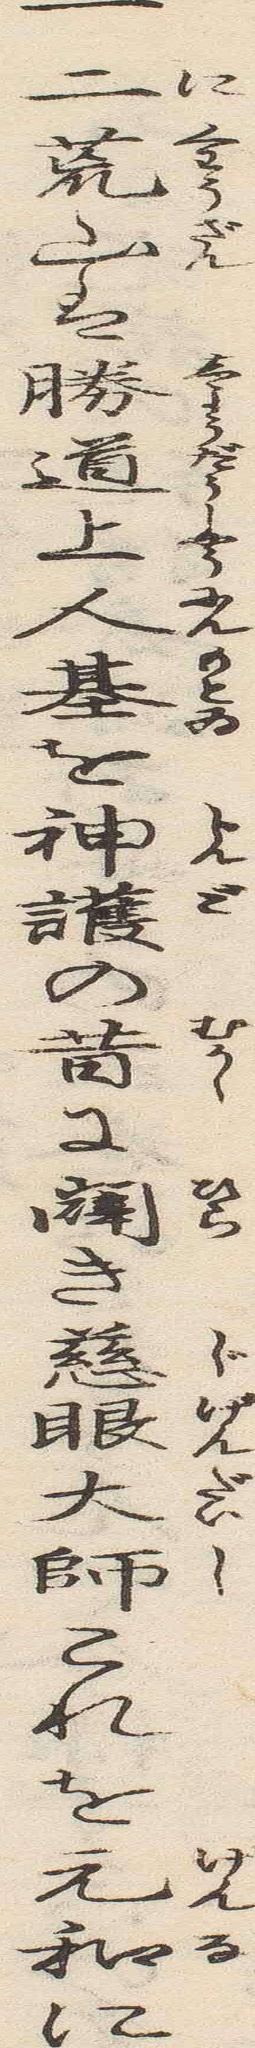一二荒山は勝道上人基を神護の昔に開き慈眼大師これを元和に
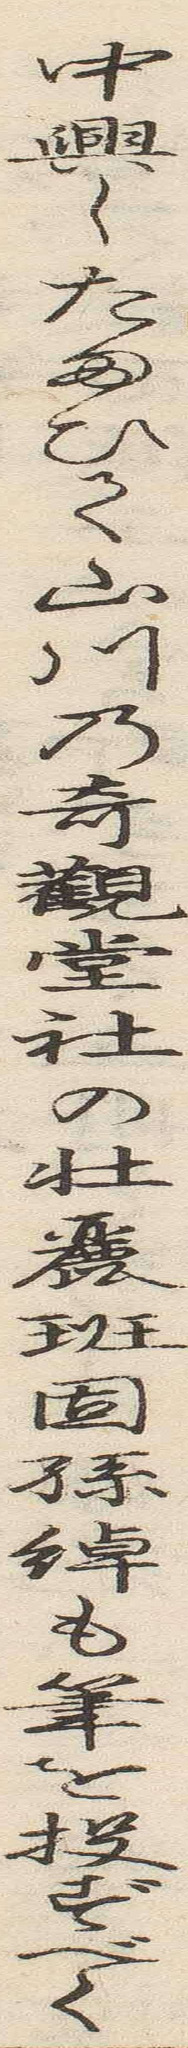中興したまひて山川の奇観堂社の壮麗班固孫綽も筆を投ずべく
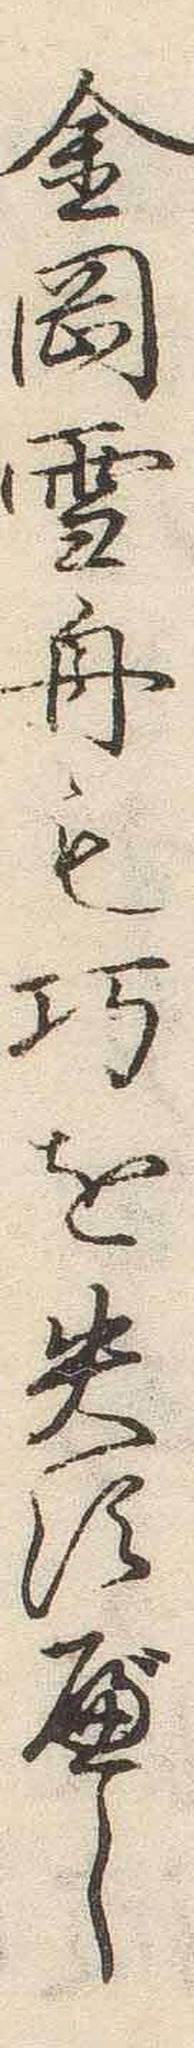金岡雪舟も巧を失すべし
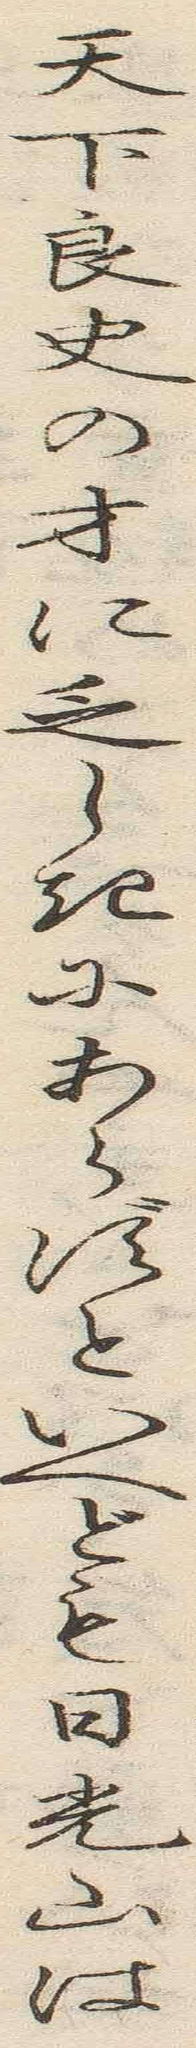天下良史の才に乏しきにあらずといへども日光山は
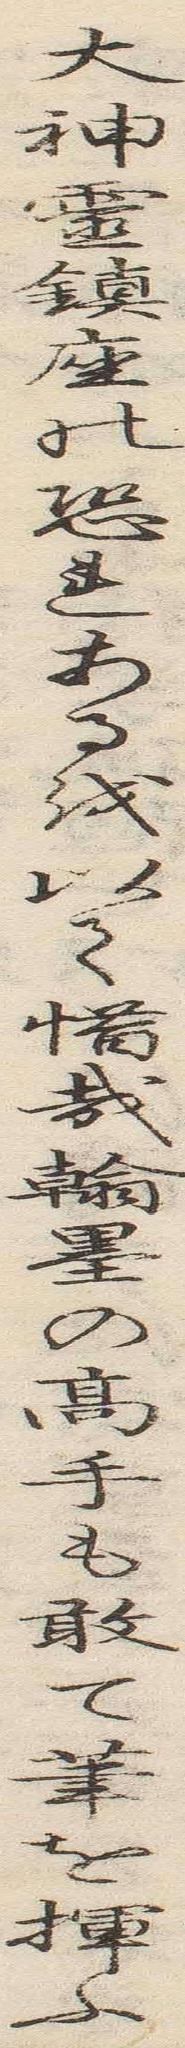大神霊鎮座の恐れあるを以て惜哉翰墨の高手も敢て筆を揮ふ
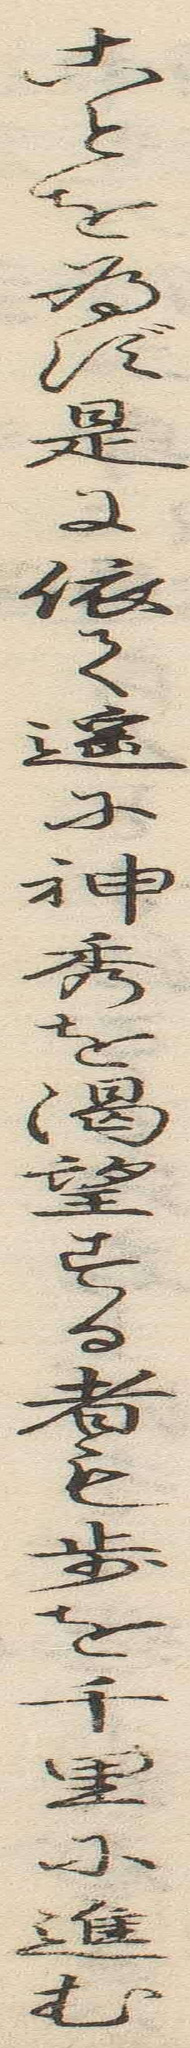ことを為ず是に依て遥に神秀を渇望する者も歩を千里に進む
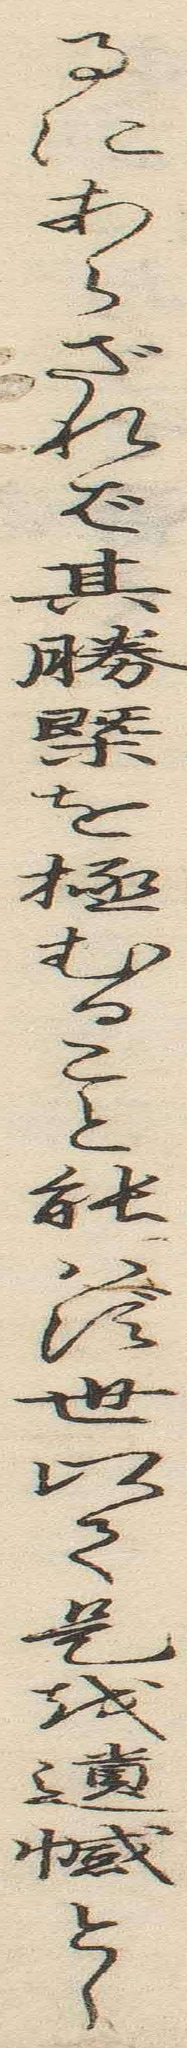るにあらざれば其勝概を極むること能はず世以て是を遺憾とし
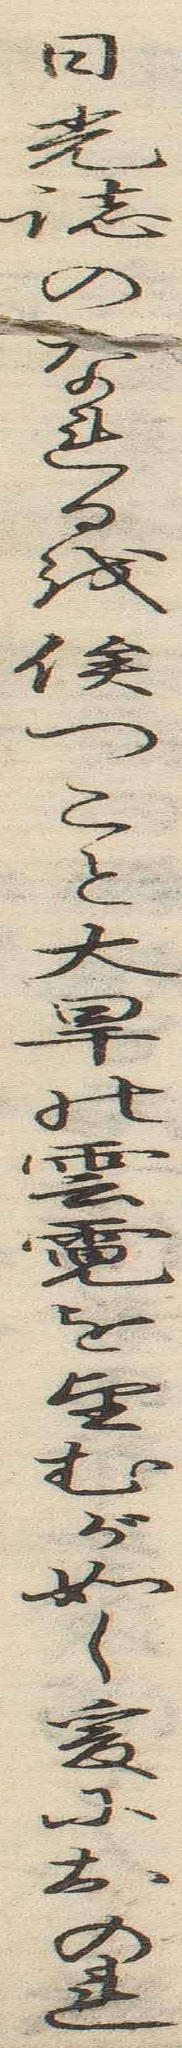日光誌のなれるを俟つこと大旱の雲霓を望むが如し爰におのれ
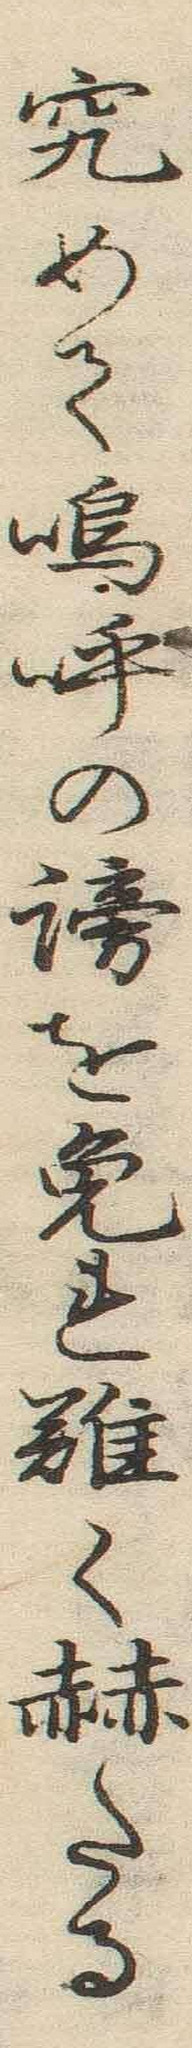究めて鳴呼の謗を免れ難く赫たる

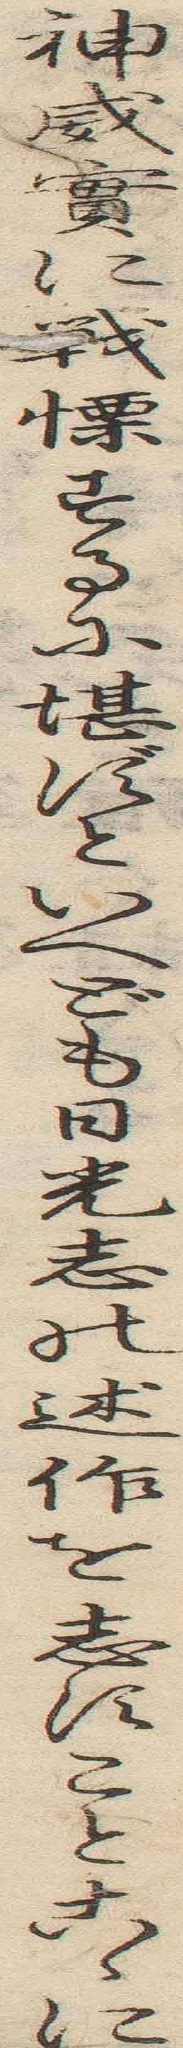神威實に戦慄するに堪ずといへども日光志の述作を志すことこゝに
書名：日光山志
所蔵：東京学芸大学附属図書館 国文学研究資料館
